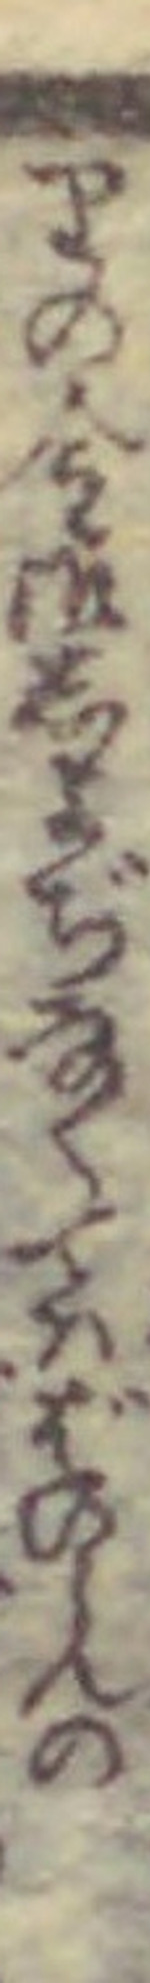りの金御しよぢなくてはばいしんの
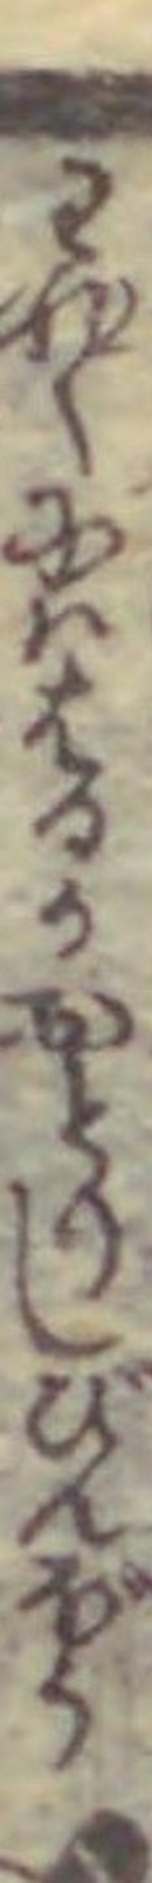われ〳〵にははるかおとりしびんぼう
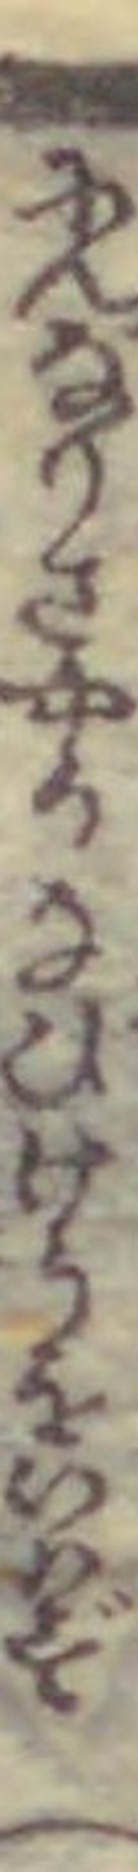にんなりさやうなひけうをいはず
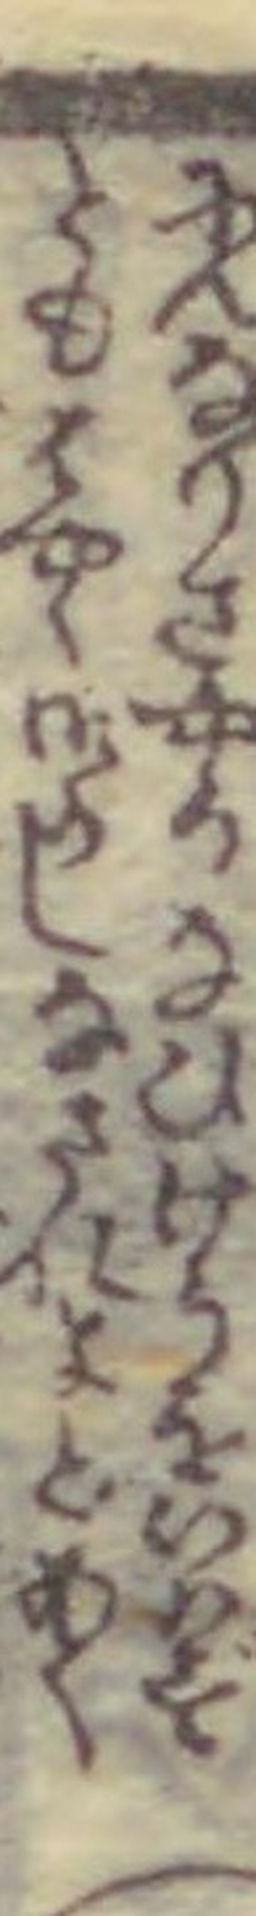ともはやく御かしなされよとあく
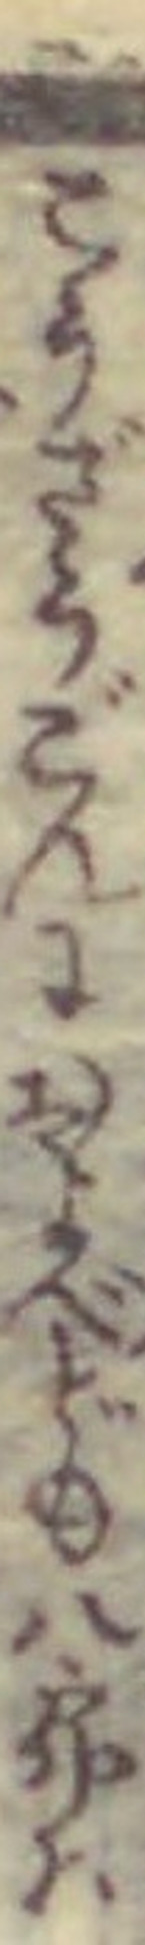こうざうごんにおよべども八郎は
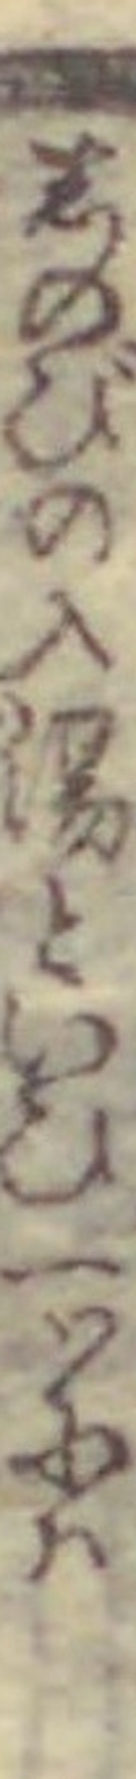しのびの入湯といひ一ッには
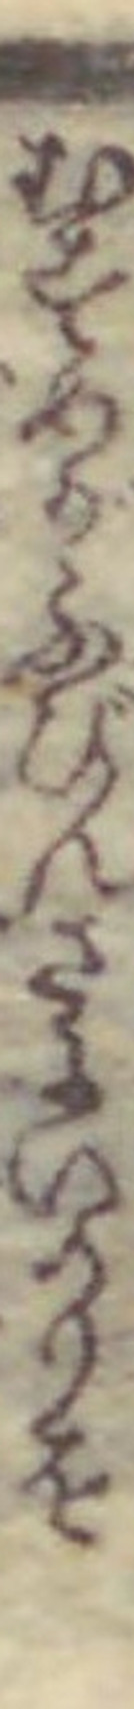むすめがふびんさにいかりを
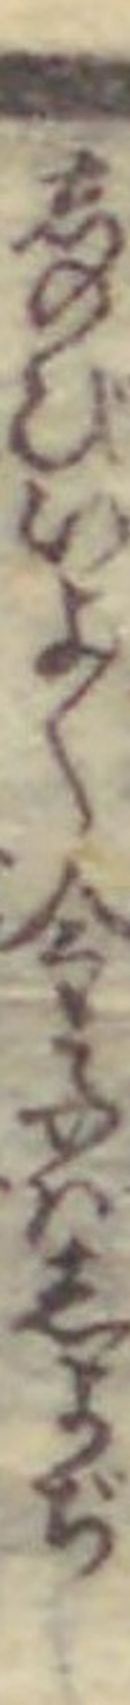しのびいよ〳〵金子はしよぢ
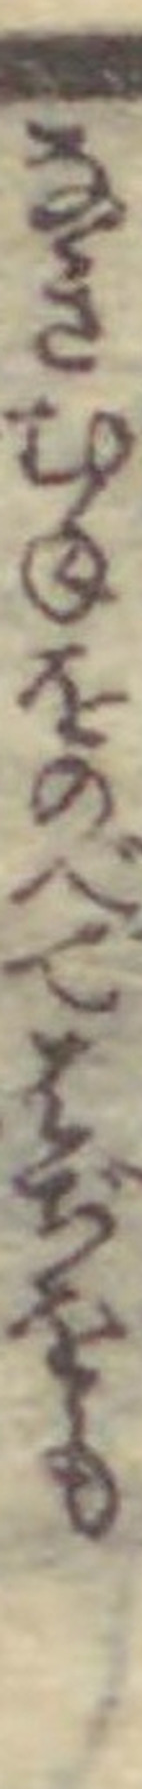なきむねをのべてはぢをも
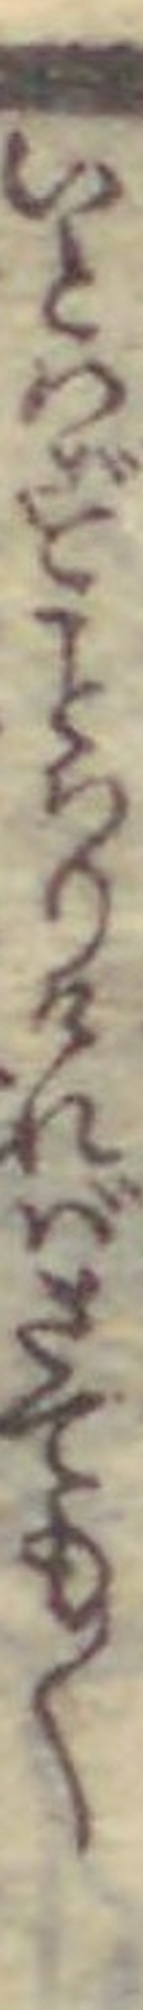いとはずことはりければさても〳〵
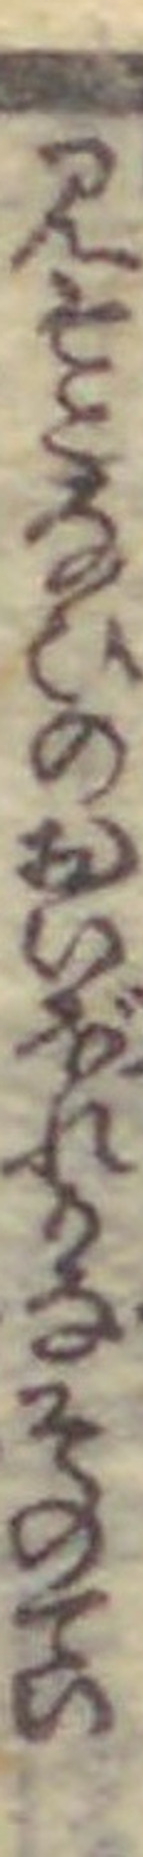見そこなひのおいぼれかなそのてい
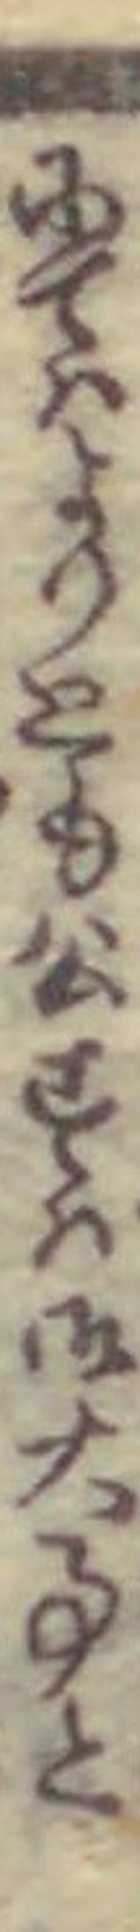にてはよりとも公すは御大事と
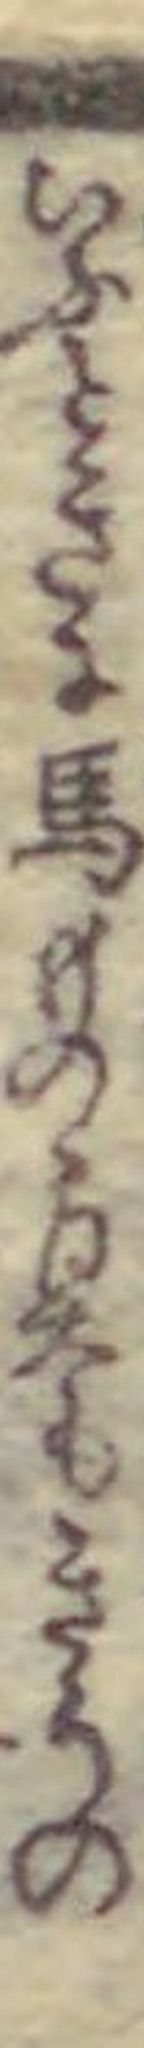いふときに馬ものゝ具もきうの
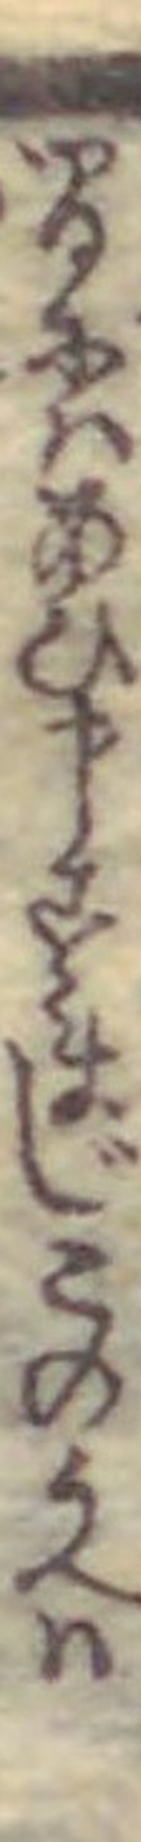間にはあひ申すまじこのうへは
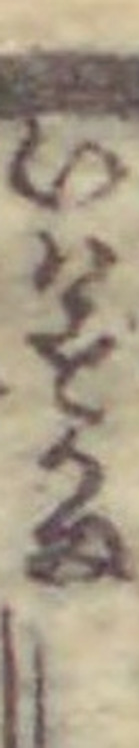いはずかま
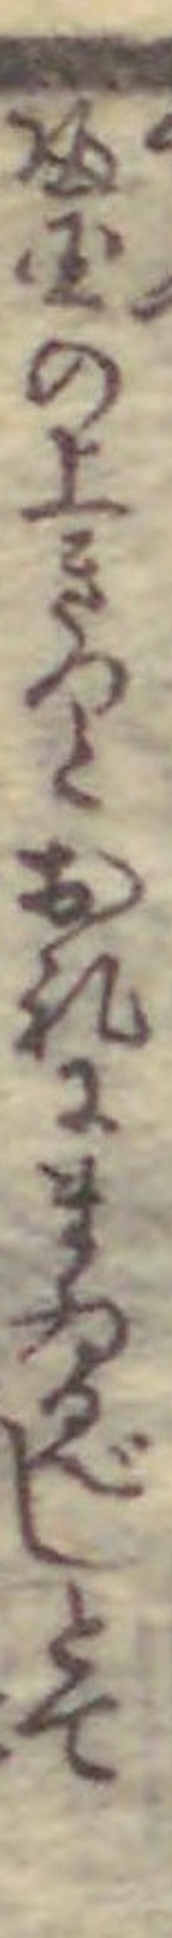帰国の上きつとお礼にまゐるべしとて
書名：八ツ目鱣因縁物語 3巻
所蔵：国立国会図書館 National Diet Library, JAPAN
